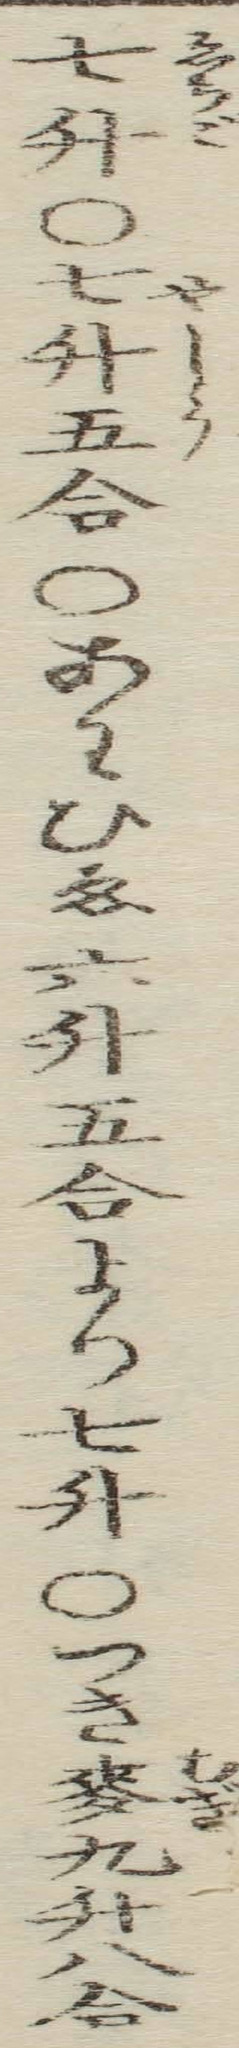七升○七升五合○あわひゑ六升五合より七升○つき麦九升八合

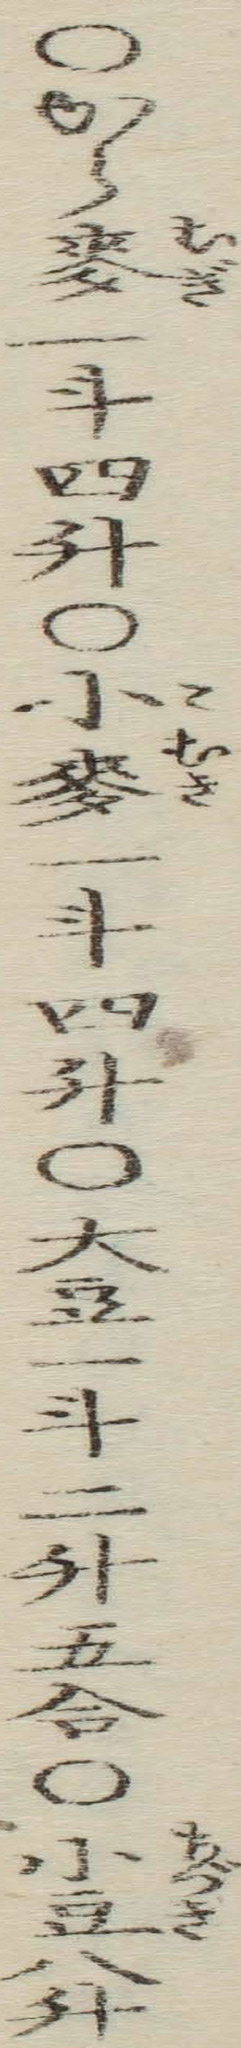○から麦一斗四升○小麦一斗四升○大豆一斗二升五合○小豆八升
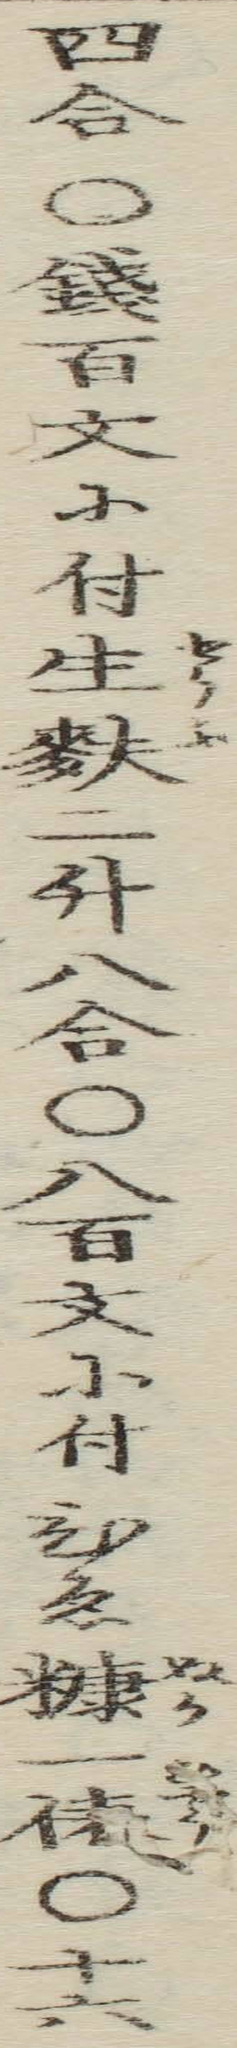四合○銭百文に付生麩二升八合○八百文に付ひゑ糠一俵○十六
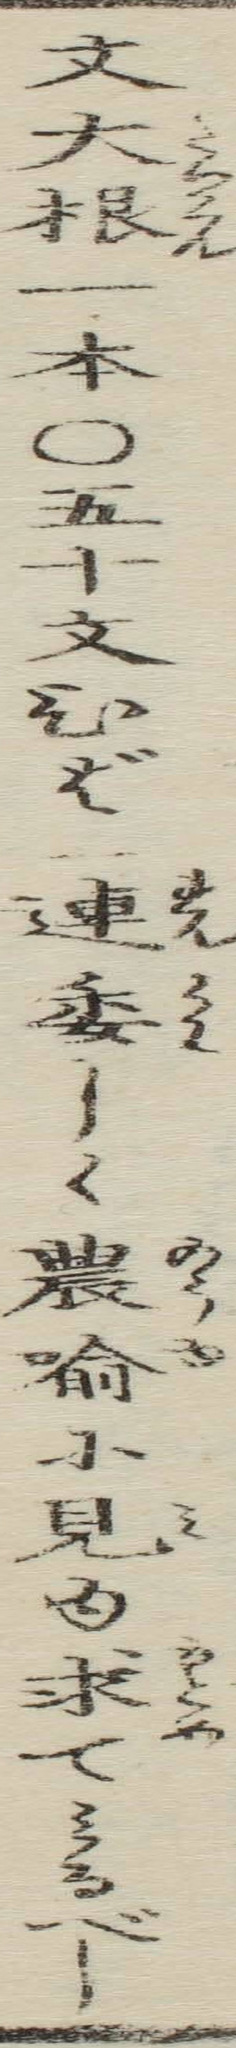文大根一本○五十文ひば一連委しく農喩に見ゆ求てみるべし
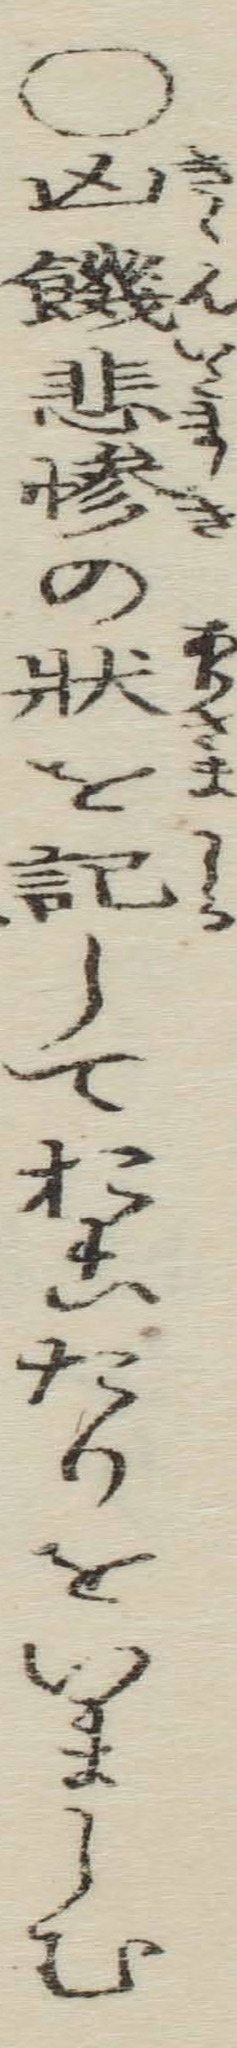○凶饑悲惨の状を記しておこたりをいましむ
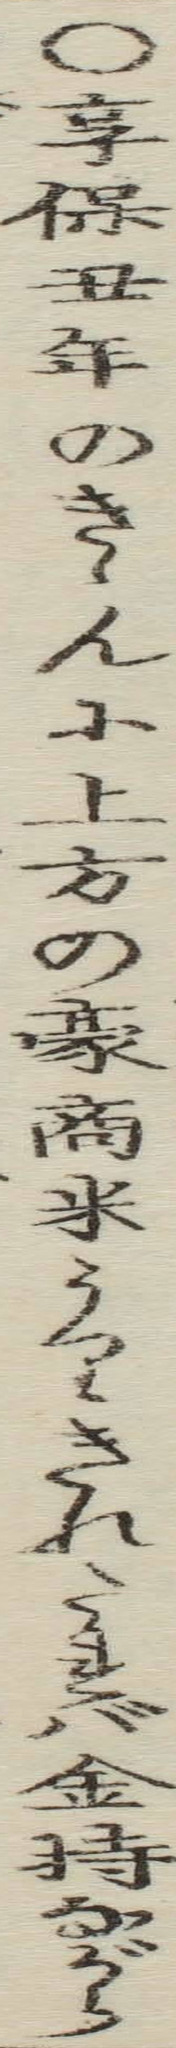○享保丑年のきゝんに上方の豪商米うりきれたれば金持ながら
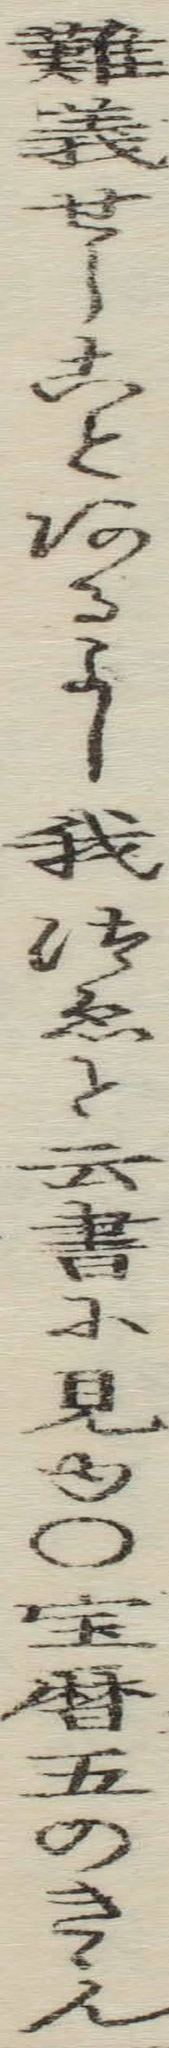難義せしことあるよし我つゑと云書に見ゆ○宝暦五のきゝん
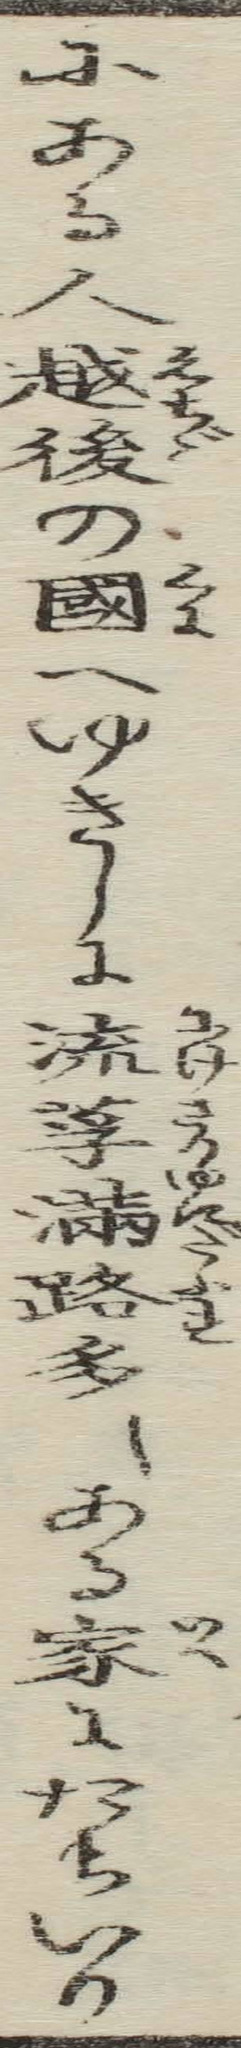にある人越後の国へゆきしに流莩満路多しある家にたちいり
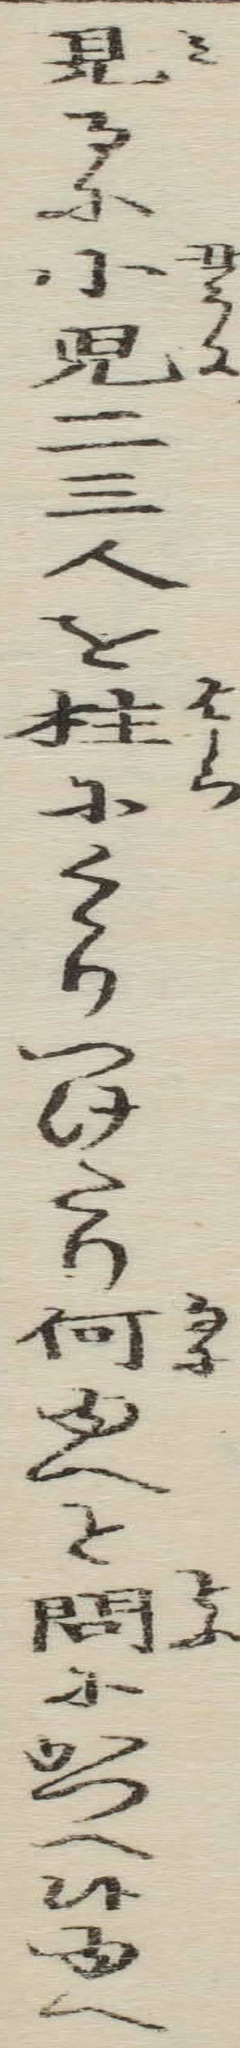見るに小児二三人を柱にくゝりつけたり何ゆへと問にかつへ候ゆへ
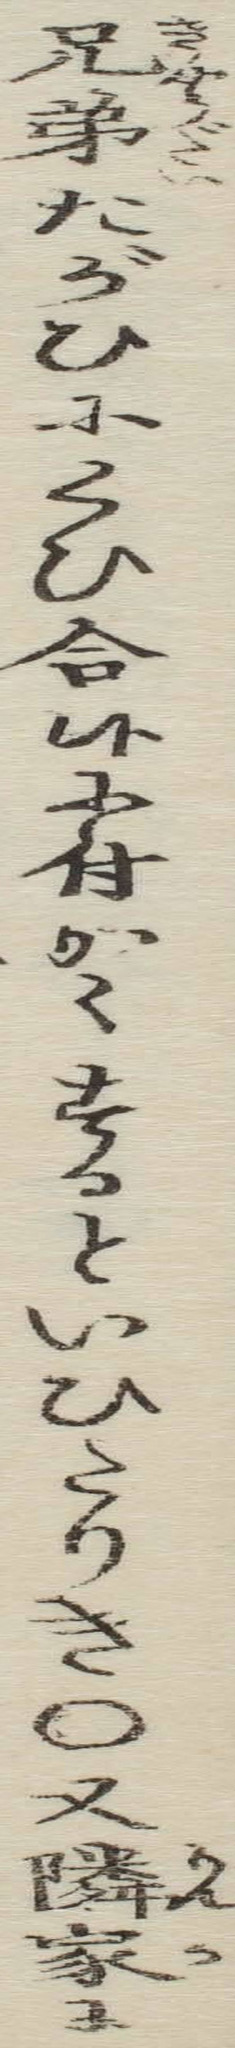兄弟たがひにくひ合候に付かくするといひたりき○又隣家に
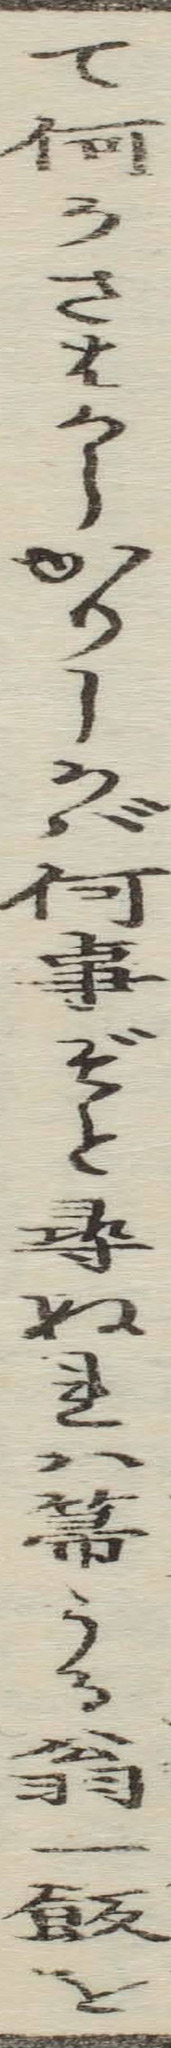て何かさはかしかりしかば何事ぞと尋ぬれは箒うる翁一飯を
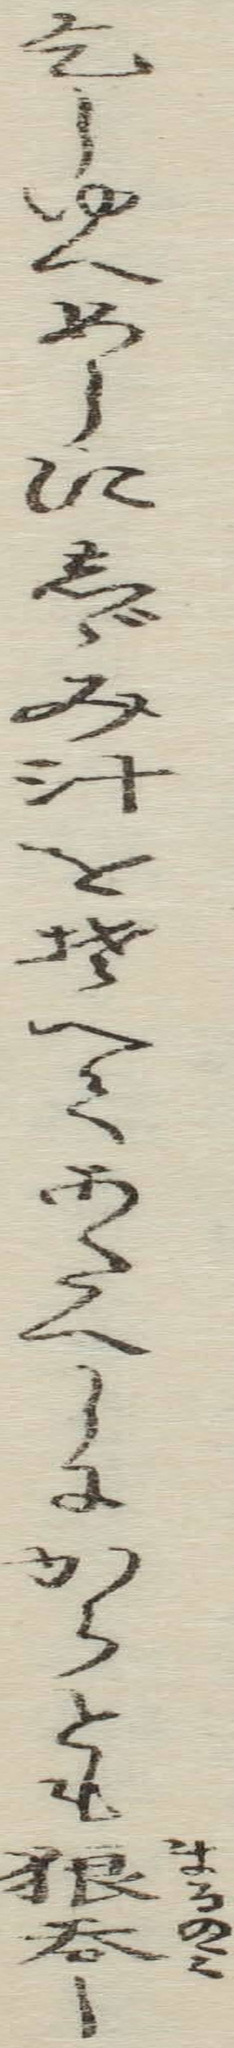乞しゆへめしにしゞみ汁をそへてあたへしにからとも狼呑し
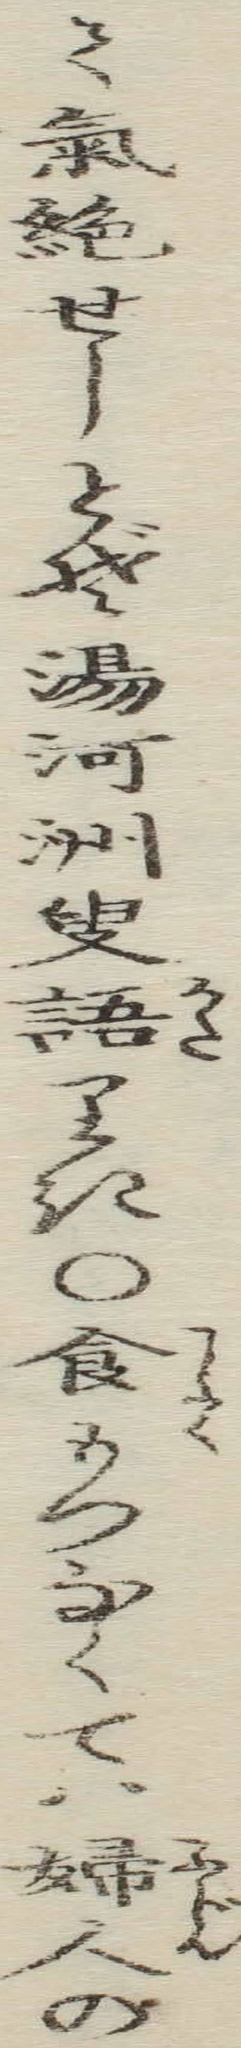て気絶せしとぞ湯河洲叟語りき○食もつなくては婦人の
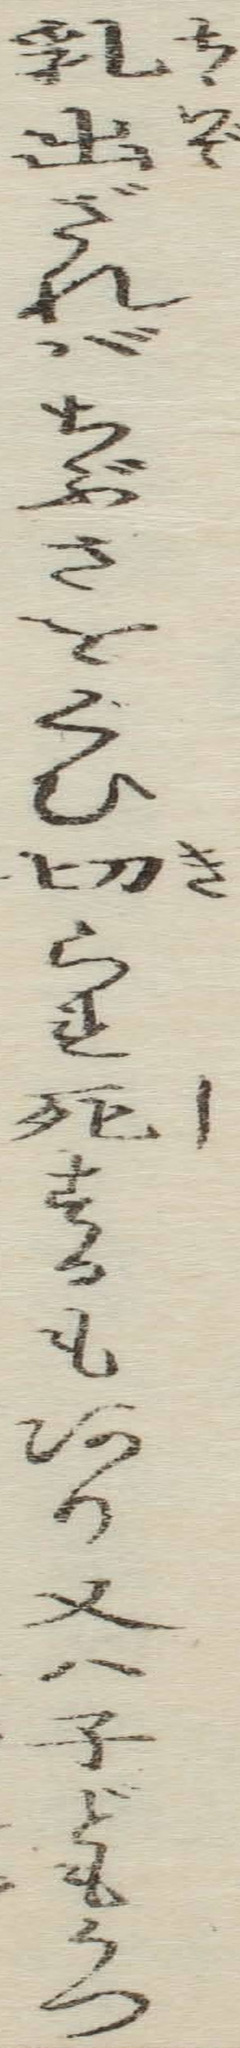乳出ざればちぶさをくひ切られ死するもあり又は子どもかつ
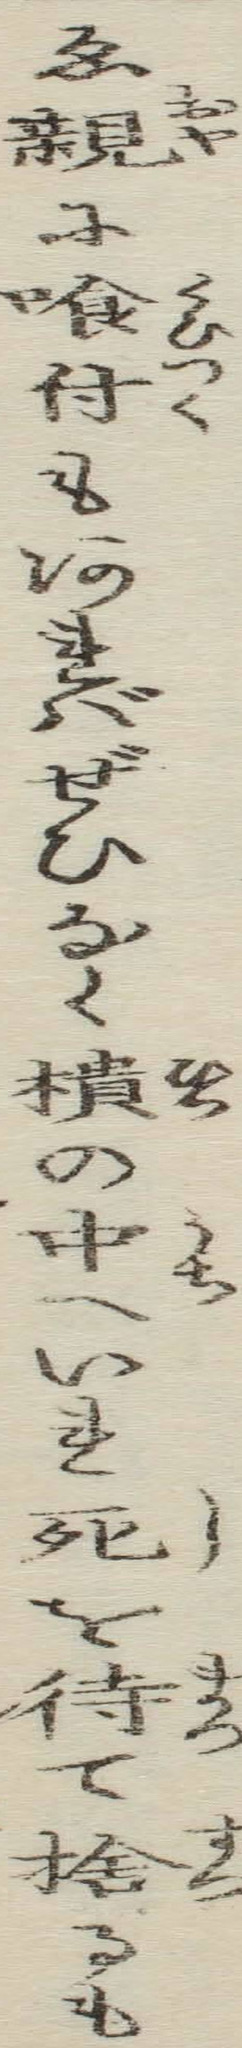ゑ親に喰付もあればぜひなく櫃の中へいれ死を待て捨るも
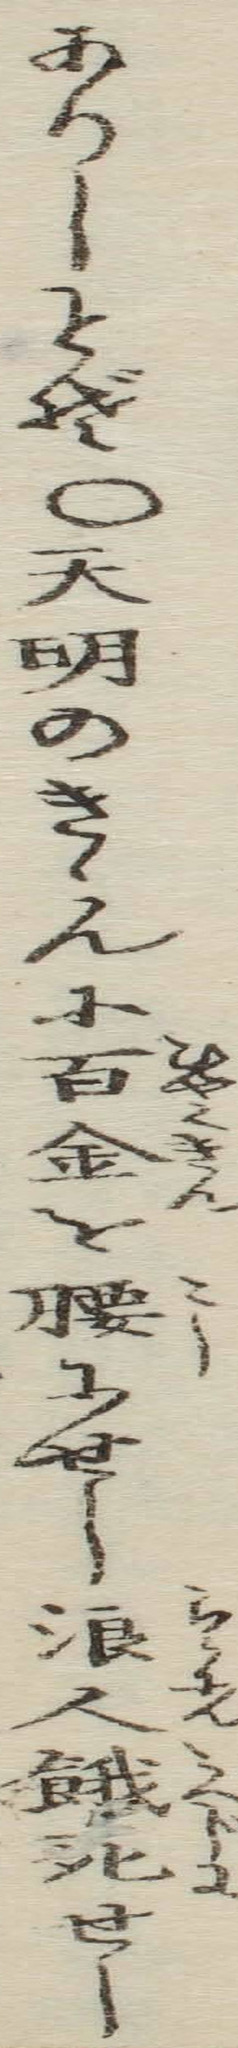ありしとぞ○天明のきゝんに百金を腰にせし浪人餓死せし
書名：救荒便覧
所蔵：国文学研究資料館
